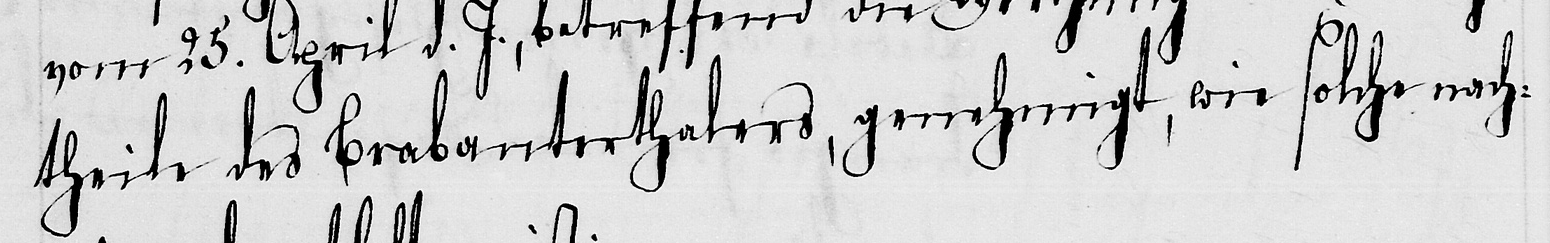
theile des Brabanterthalers, genehmigt, wie solche nach¬
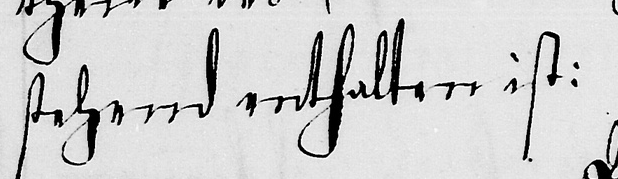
stehend enthalten ist:
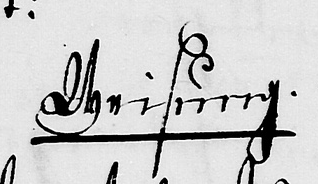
Weisung.
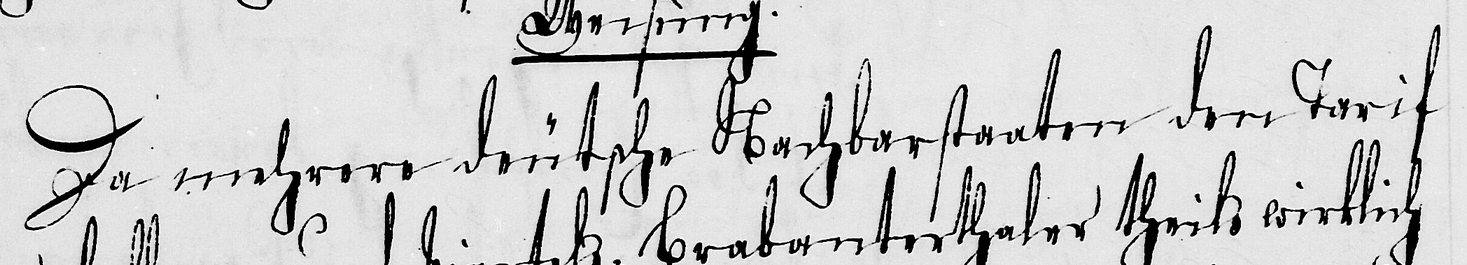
Da mehrere deutsche Nachbarstaaten den Tarif
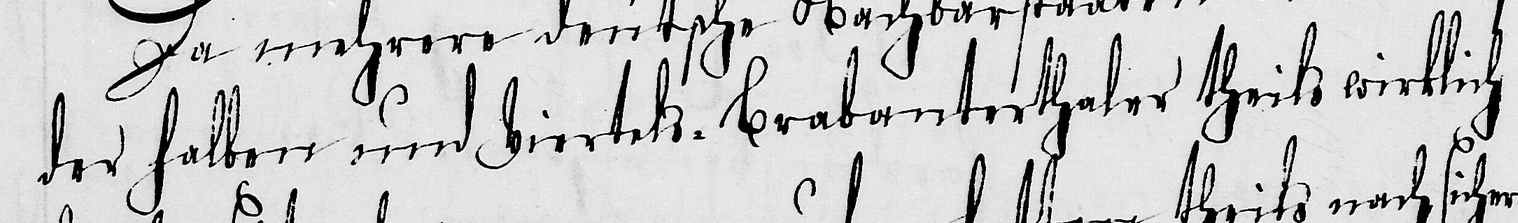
der halben und Viertels-Brabanterthaler theils wirklich
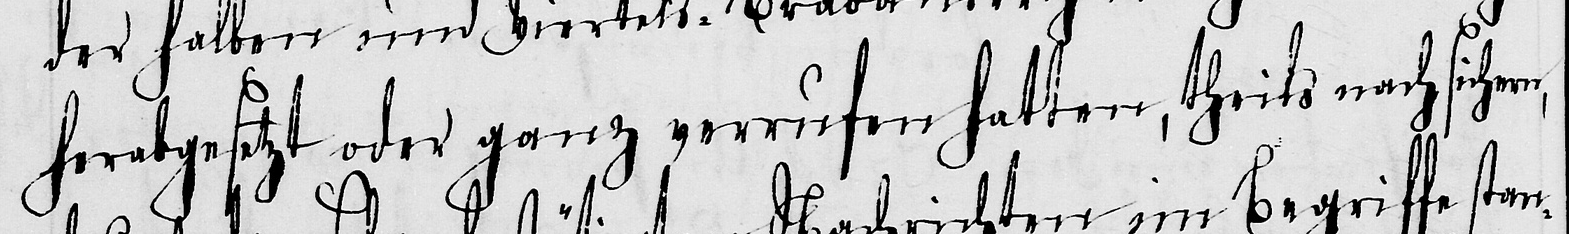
herabgesetzt oder ganz verrufen hatten, theils nach siche¬
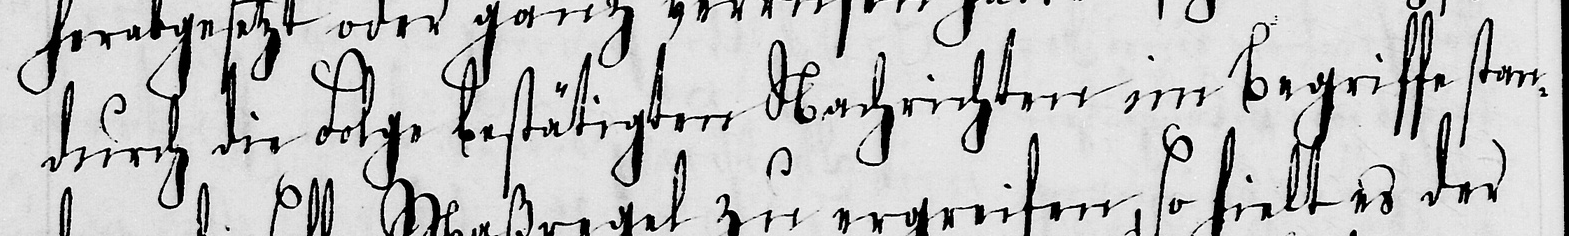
durch die Folge bestätigten Nachrichten im Begriffe stan¬
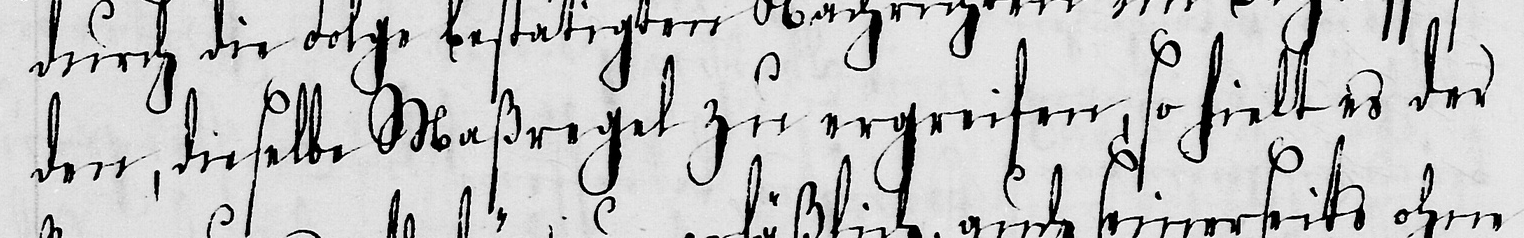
den, dieselbe Maßregel zu ergreifen, so hielt es der
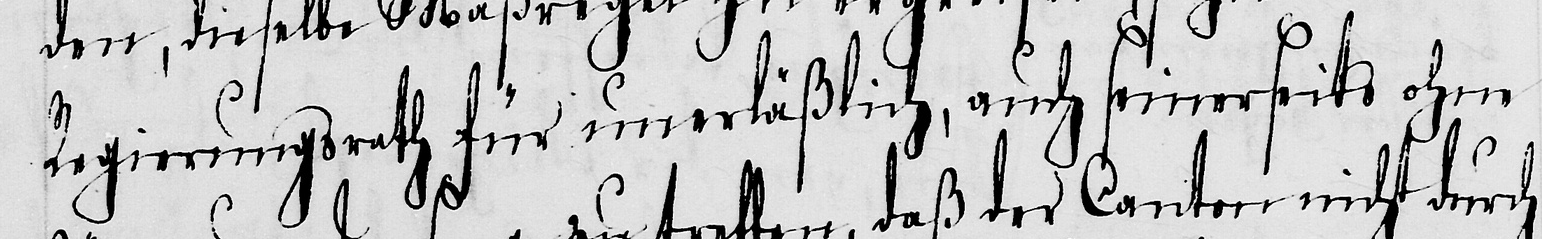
Regierungsrath für unerläßlich, auch seinerseits ohne
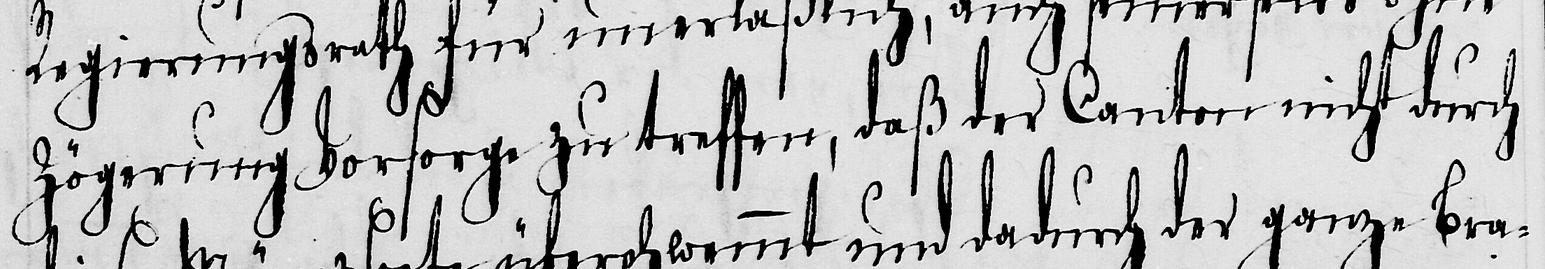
Zögerung Vorsorge zu treffen, daß der Canton nicht durch
